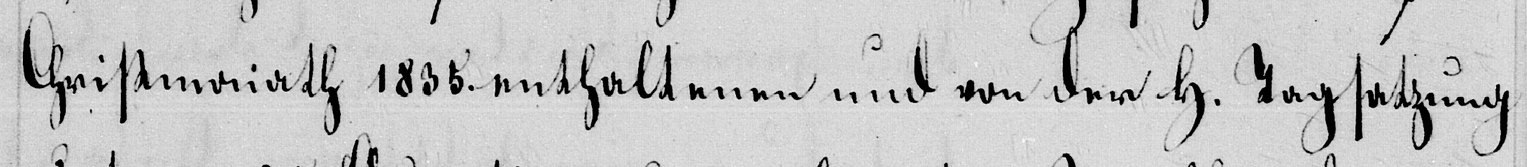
Christmonath 1835. enthaltenen und von der H. Tagsatzung
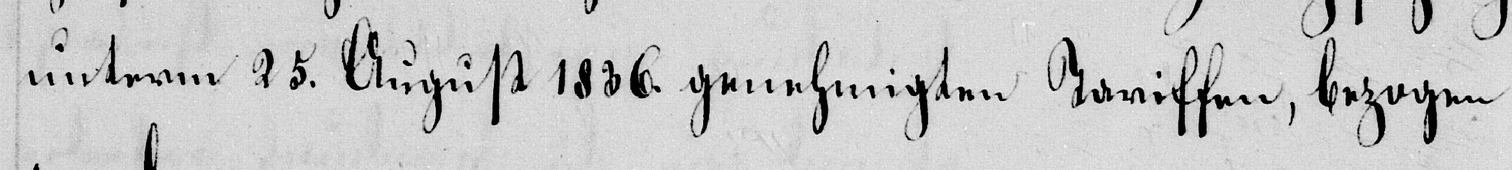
unterm 25. August 1836. genehmigten Tariffen, bezogen
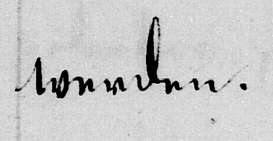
werden.
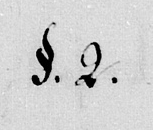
§. 2.
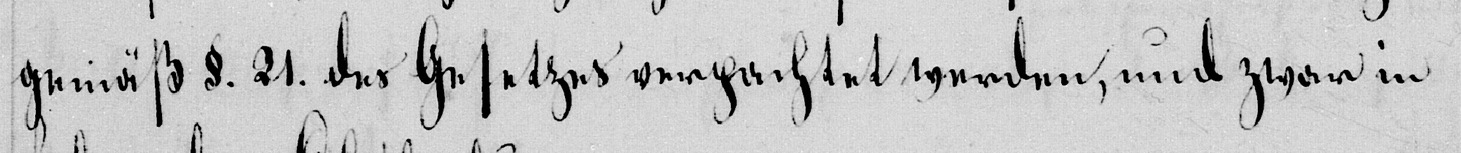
gemäß §. 21. des Gesetzes verpachtet werden, und zwar in
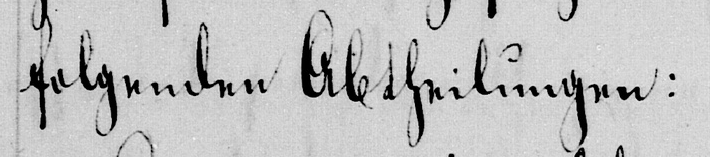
folgenden Abtheilungen:
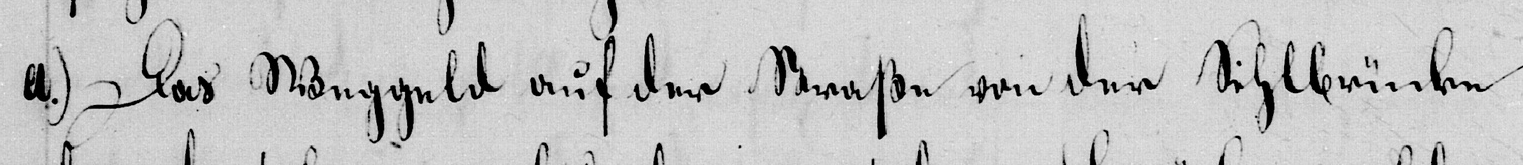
a.) Das Weggeld auf der Straße von der Sihlbrücke
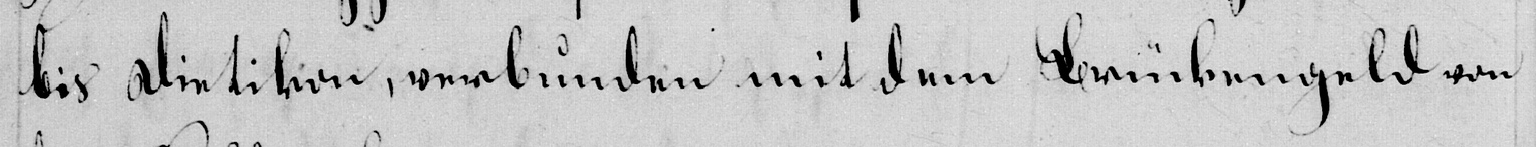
bis Uitikon, verbunden mit dem Brückengeld von
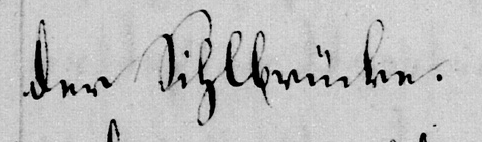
der Sihlbrücke.
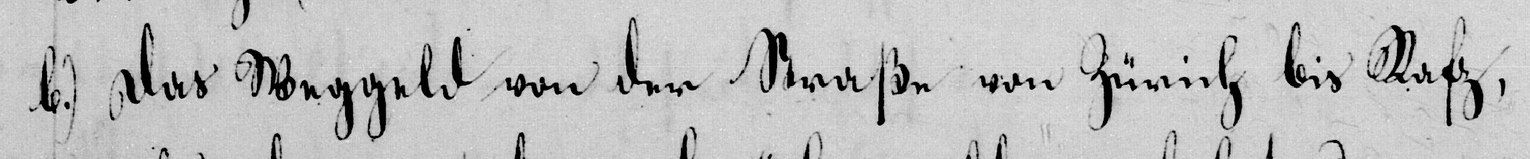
b.) Das Weggeld von der Straße von Zürich bis Rafz,
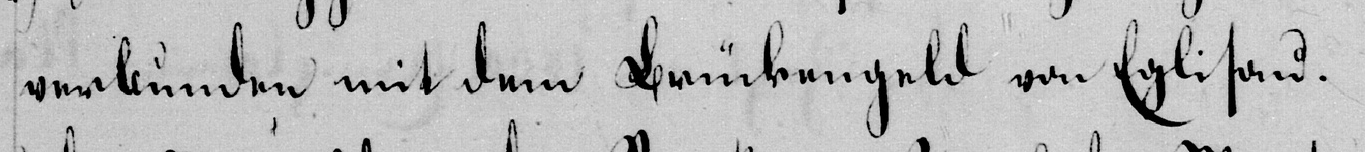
verbunden mit dem Brückengeld von Eglisau.
